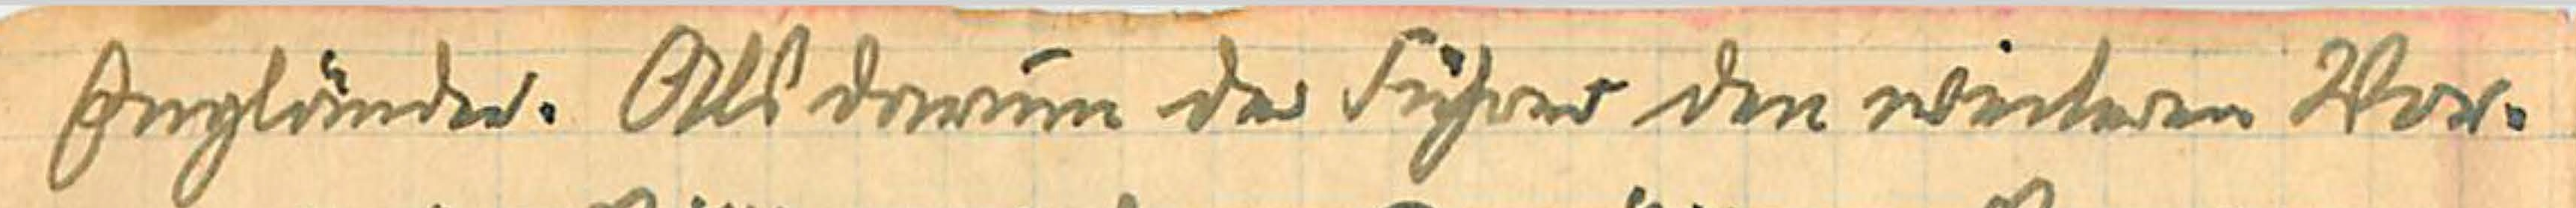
Engländer. Als darum der Führer den weiteren Vor-
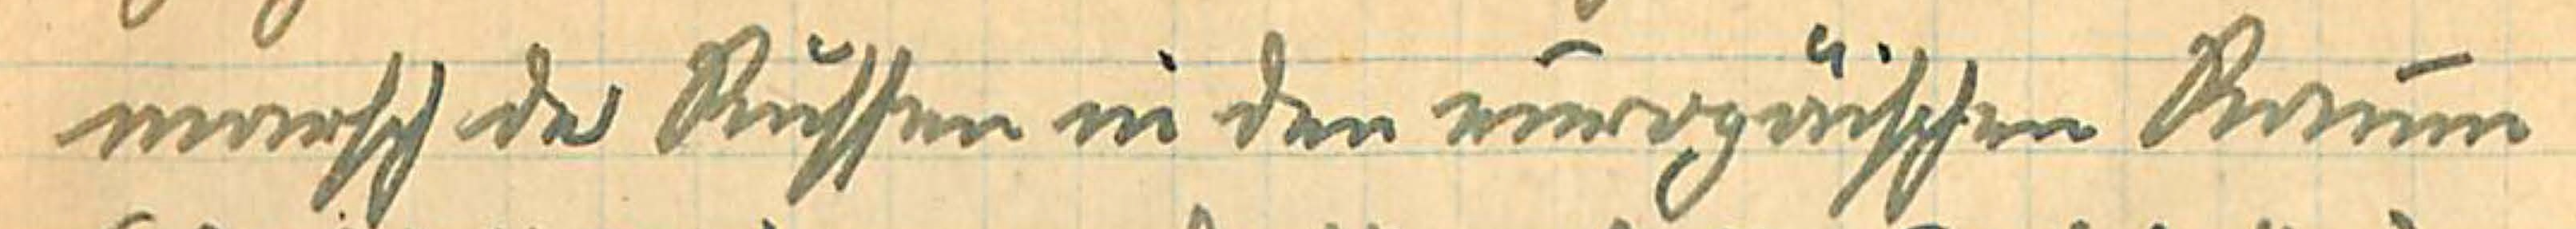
marsch der Russen in den europäischen Raum
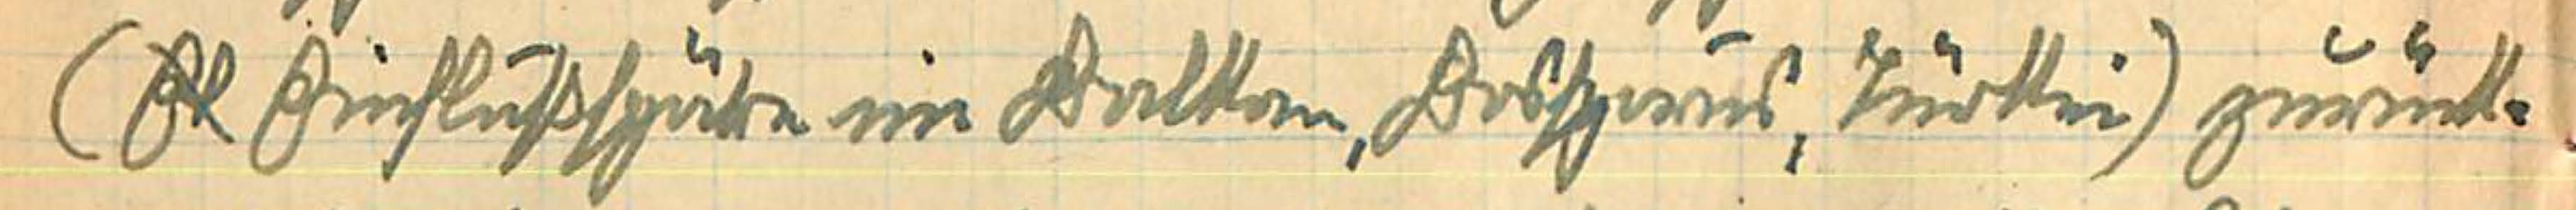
(Eb Einflußsphäre im Balkan, Bosporus, Türkei) zurück-
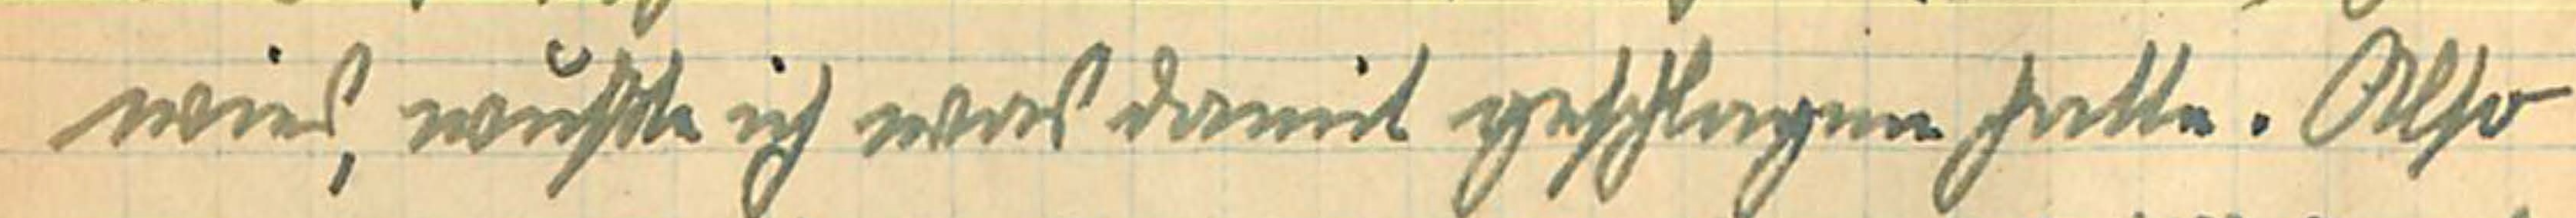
wies, wußte ich was damit geschlagen hatte. Also
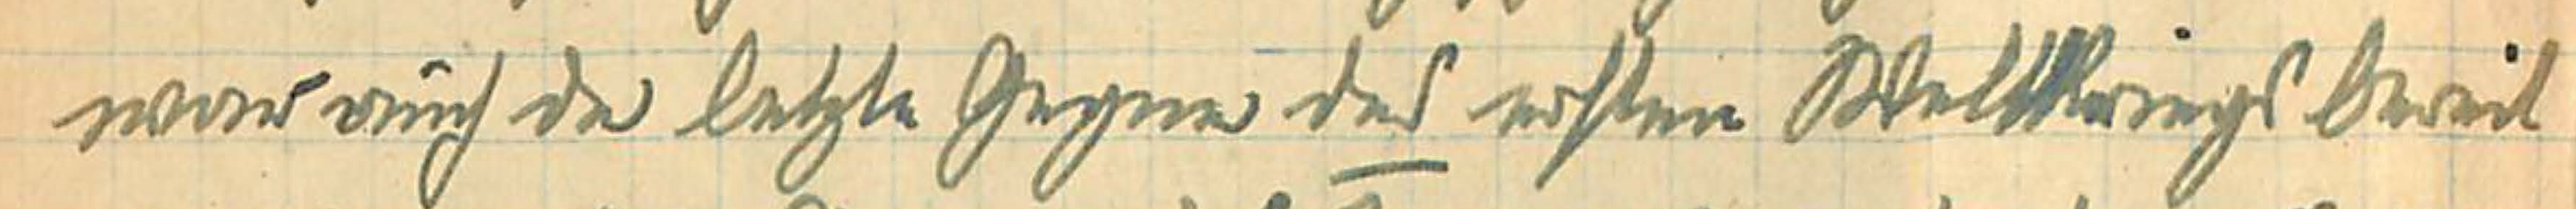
war auch der letzte Gegner des ersten Weltkriegs bereit
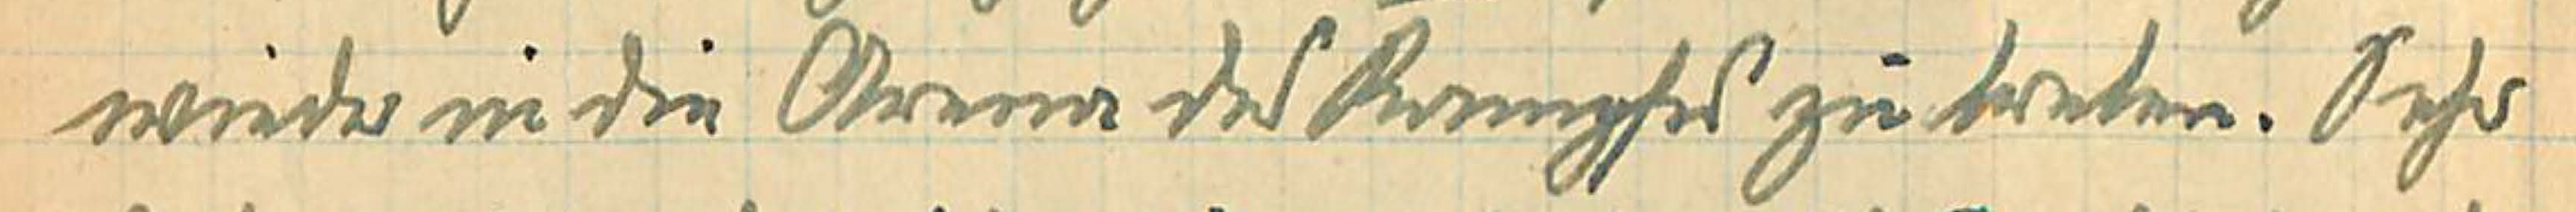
wieder in die Arena des Kampfes zu treten. Sehr
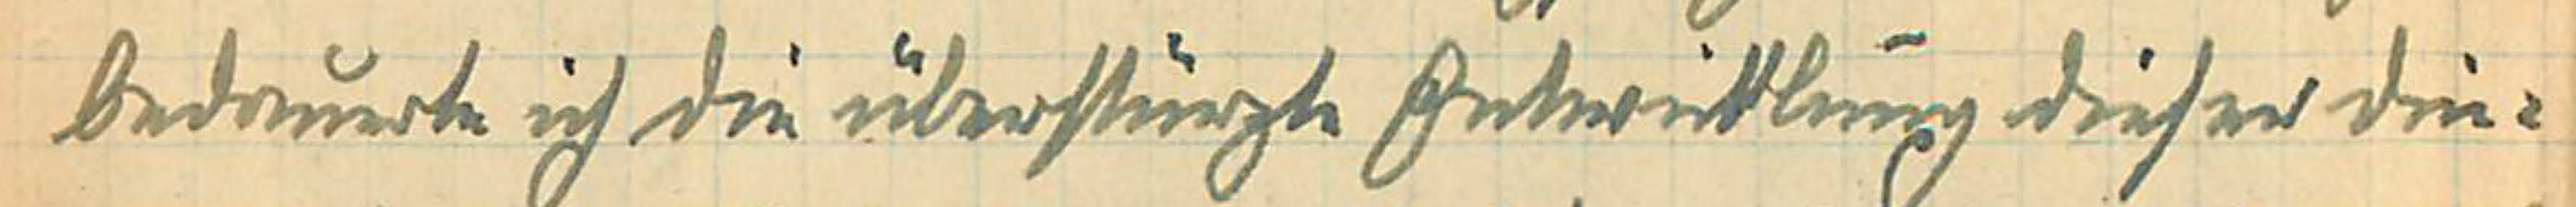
bedauerte ich die überstürzte Entwicklung dieser Din-
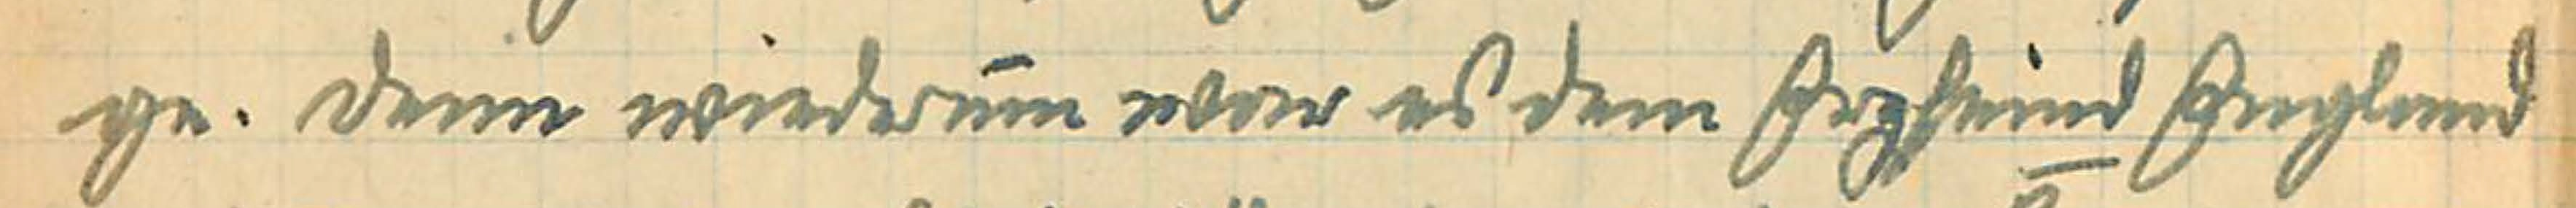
ge. Denn wiederum war es dem Erzfeind England
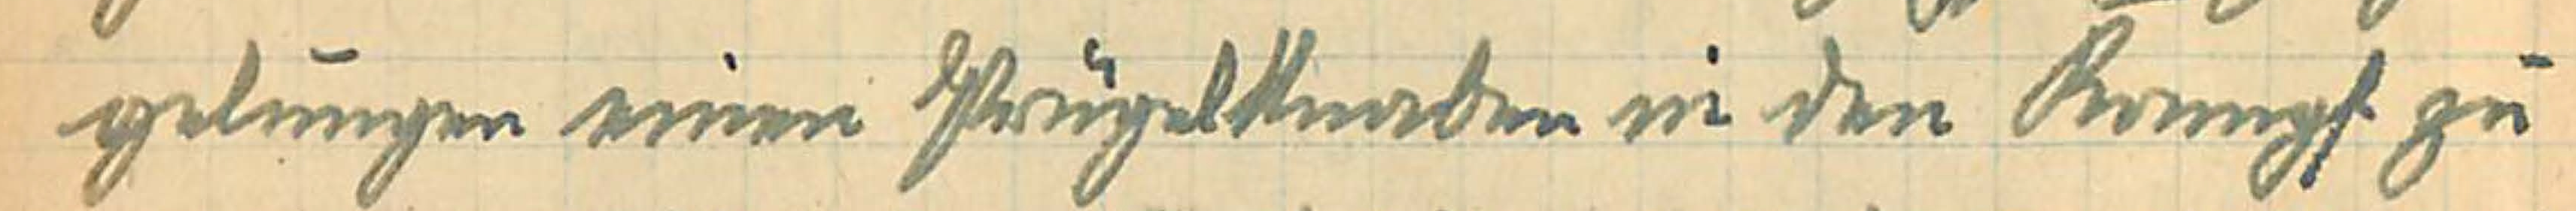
gelungen einen Prügelknaben in den Kampf zu
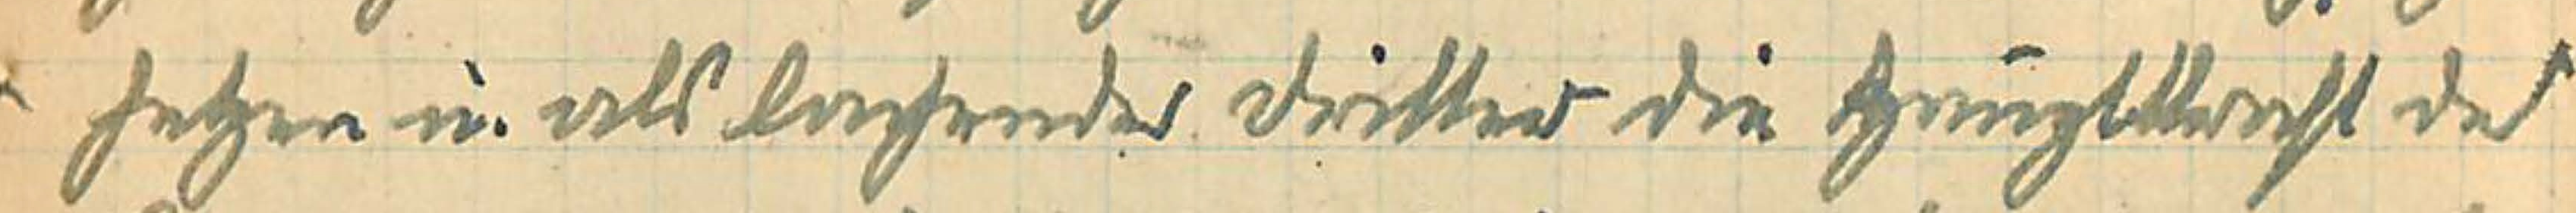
hetzen u. als lachender Dritter die Hauptkraft des
